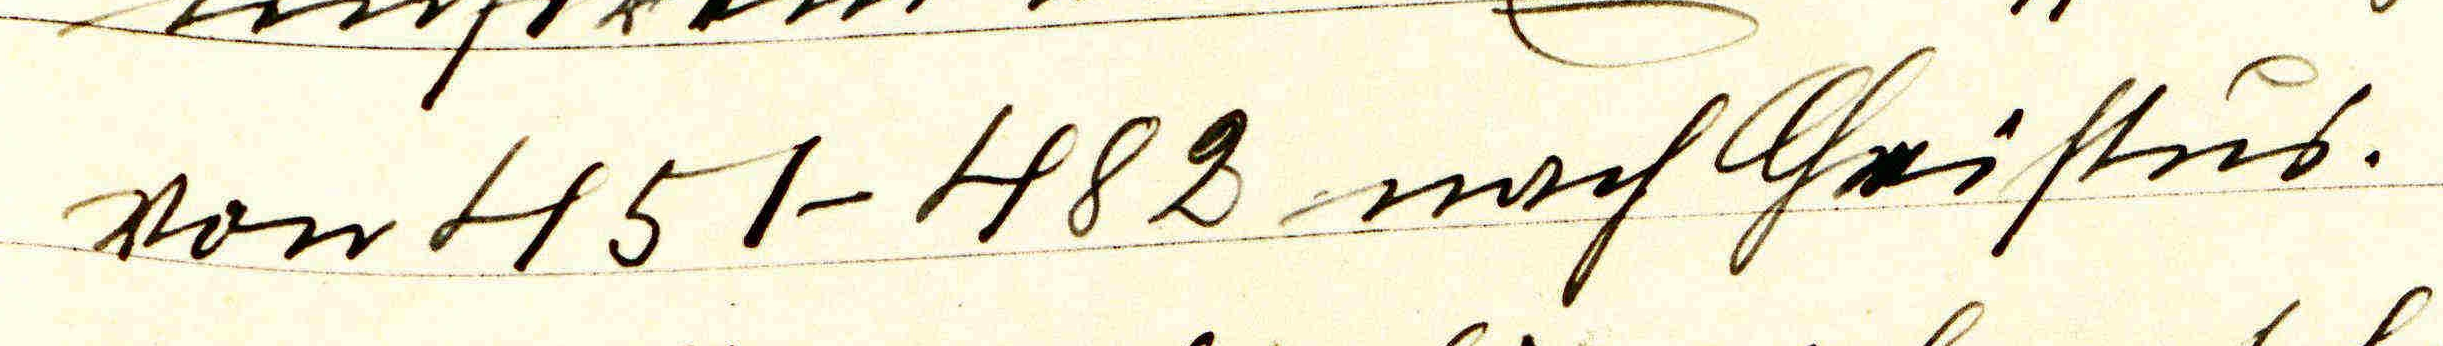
von 451-482 nach Christus.
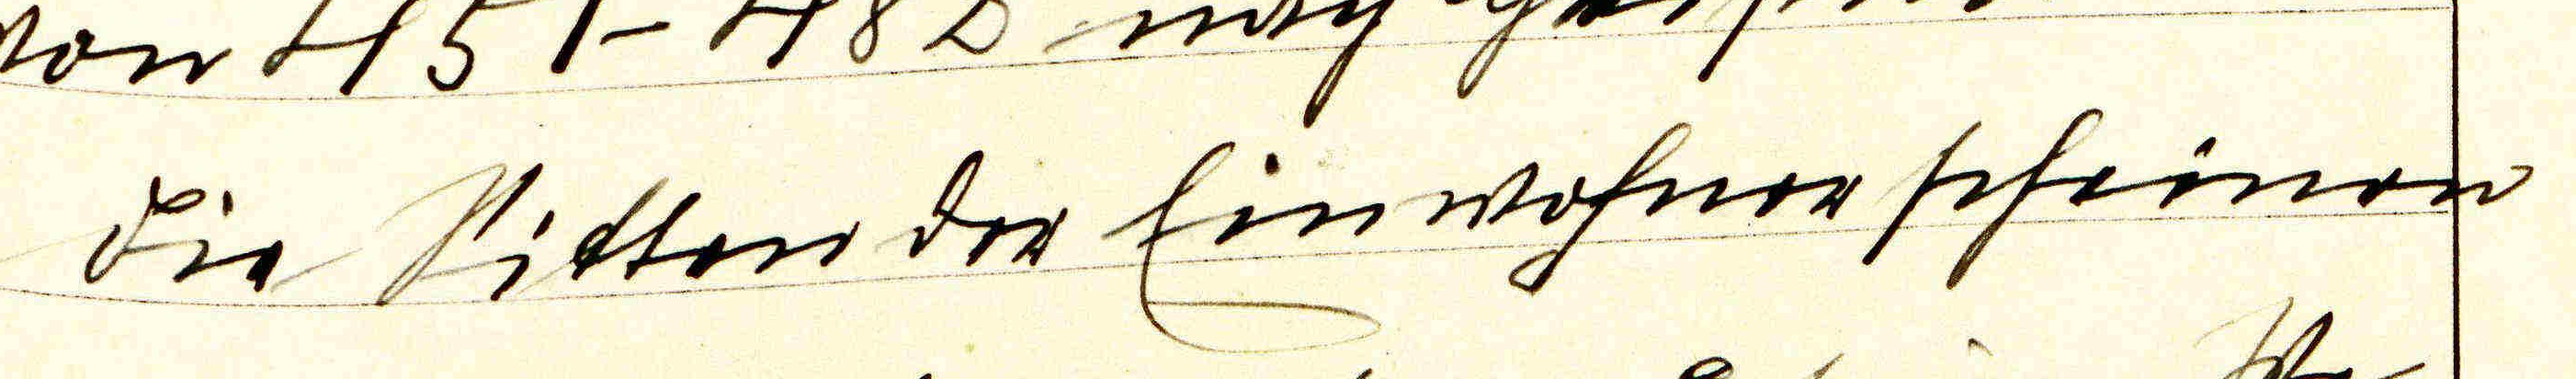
Die Sitten der Einwohner scheinen
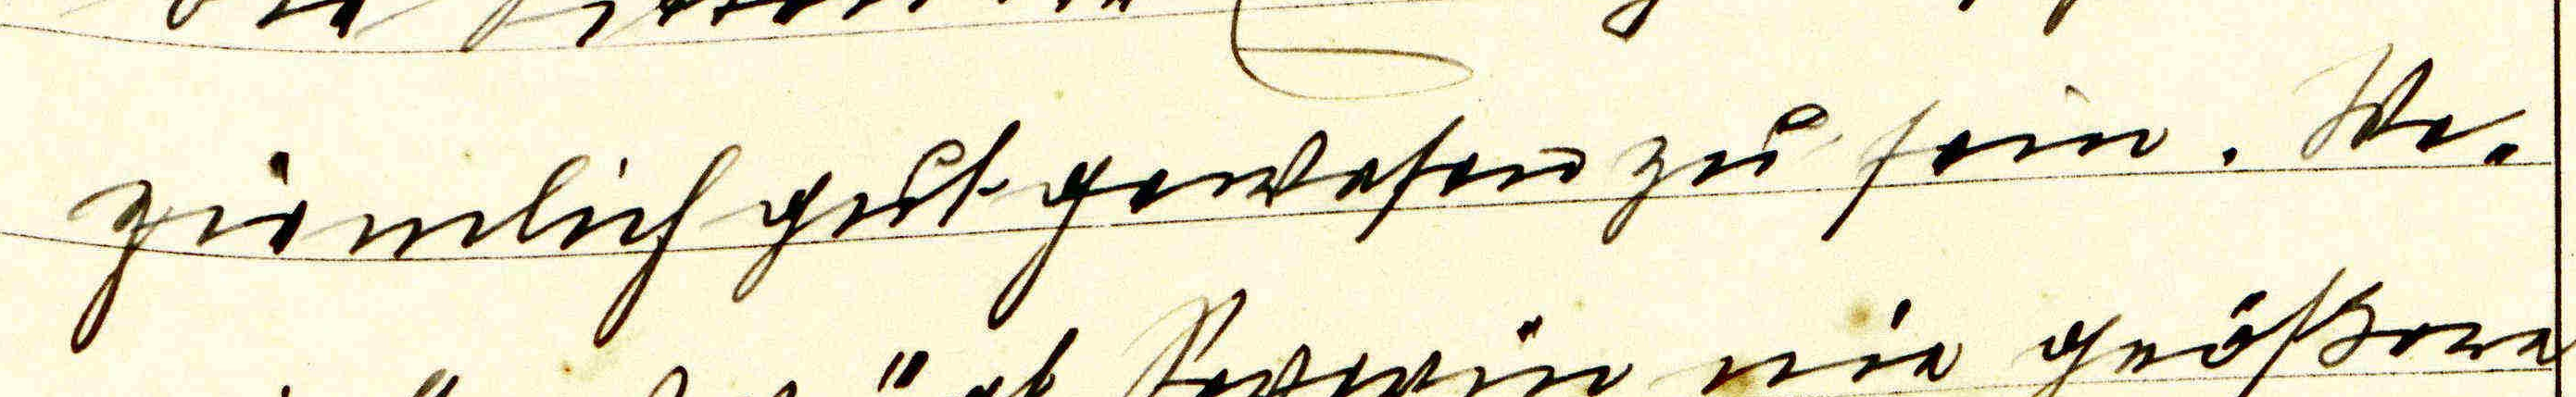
ziemlich gut gewesen zu sein. We-
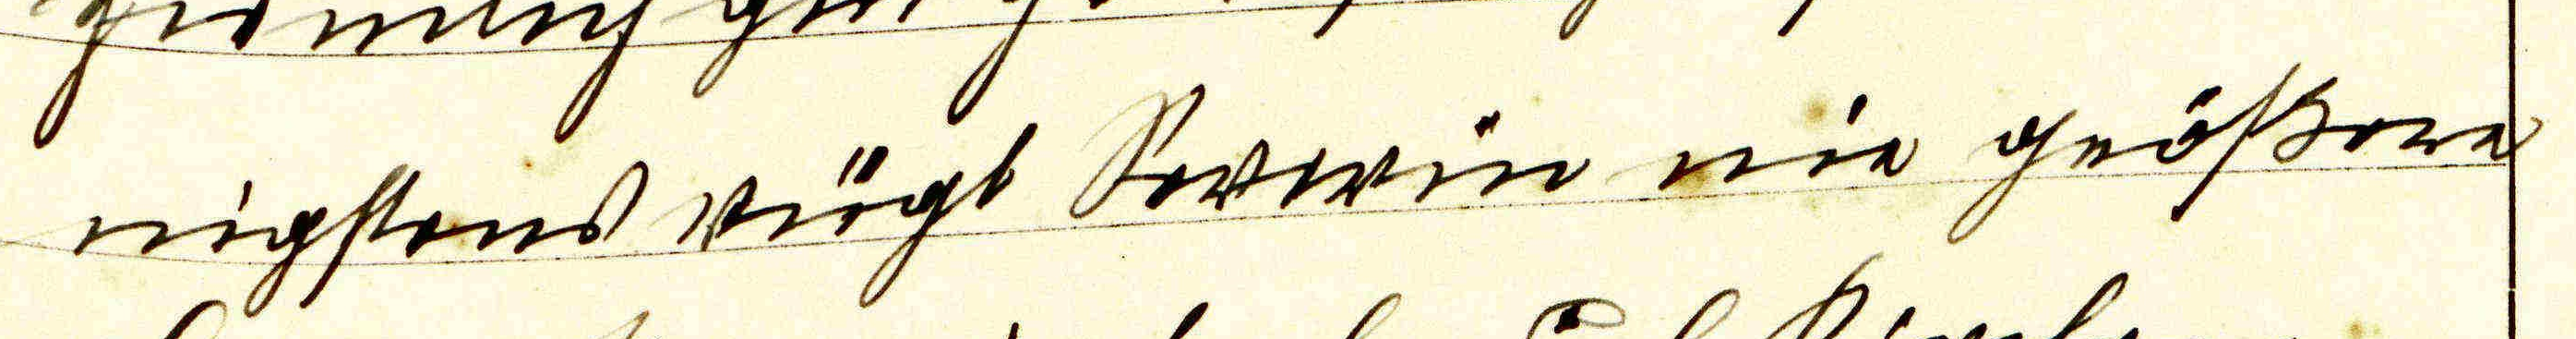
nigstens rügt Severin nie größere
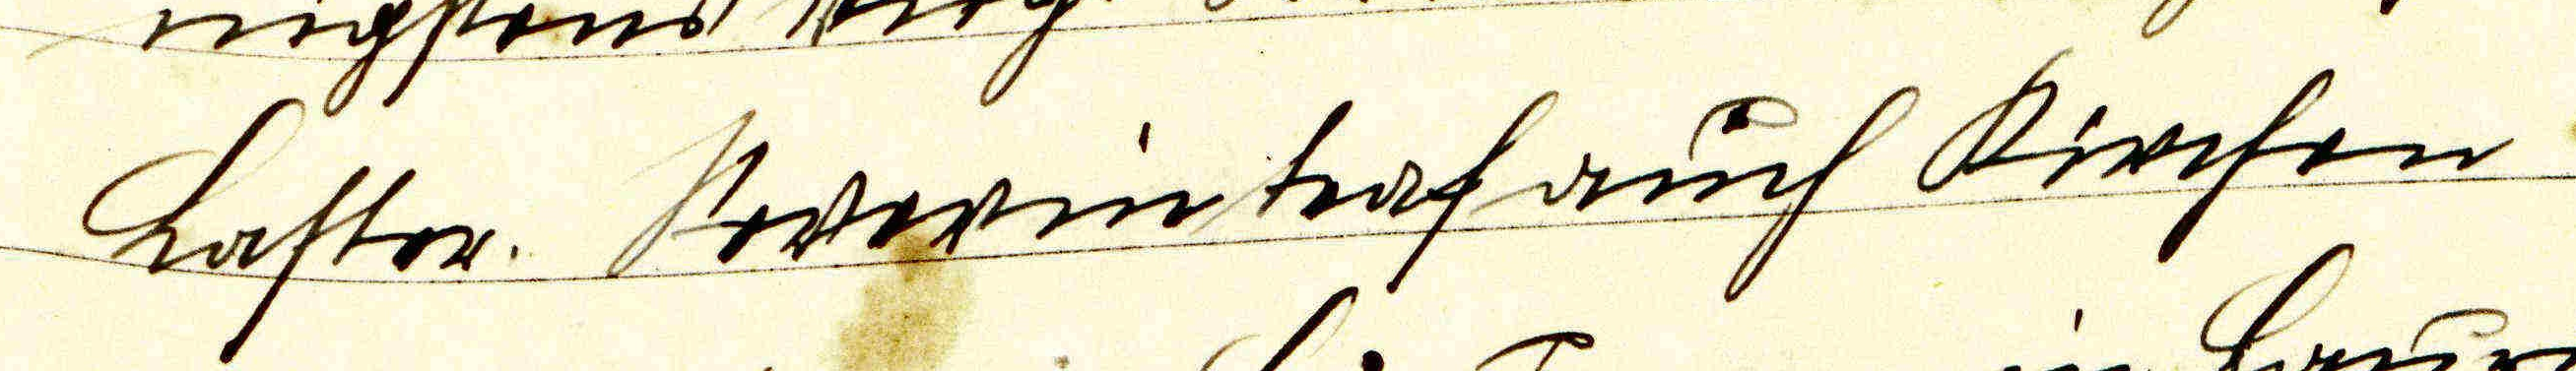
Laster. Severin traf auch Kirchen
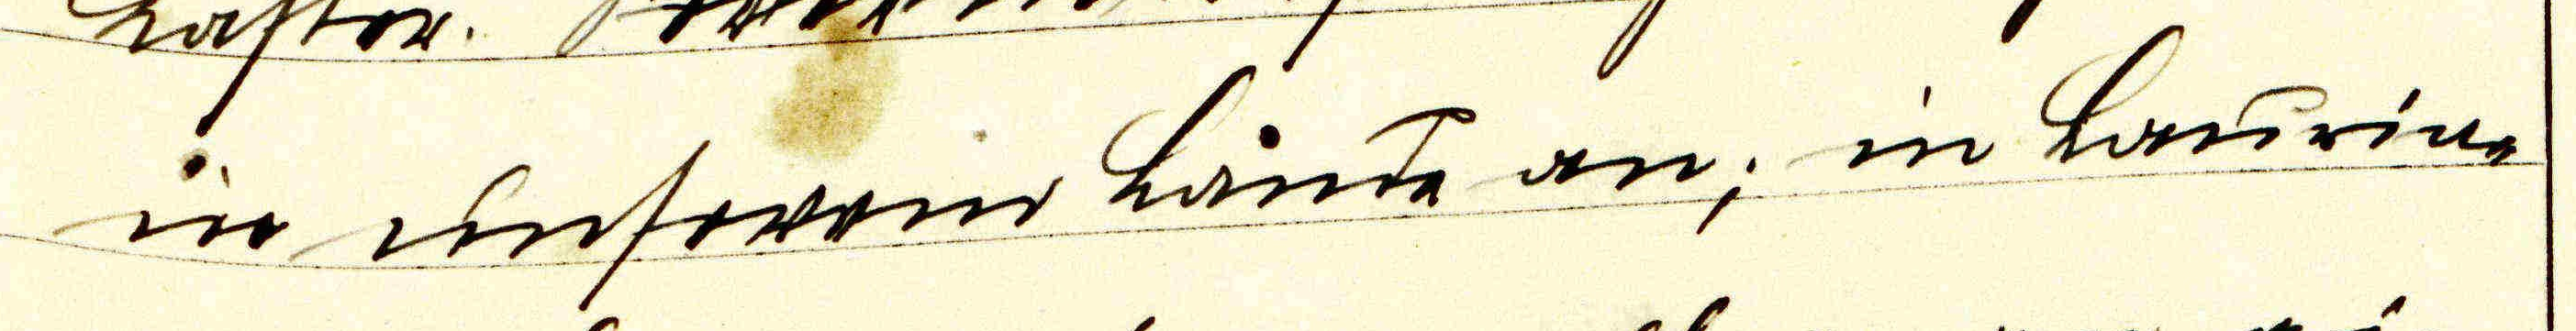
in unserem Lande an; in Lauria-
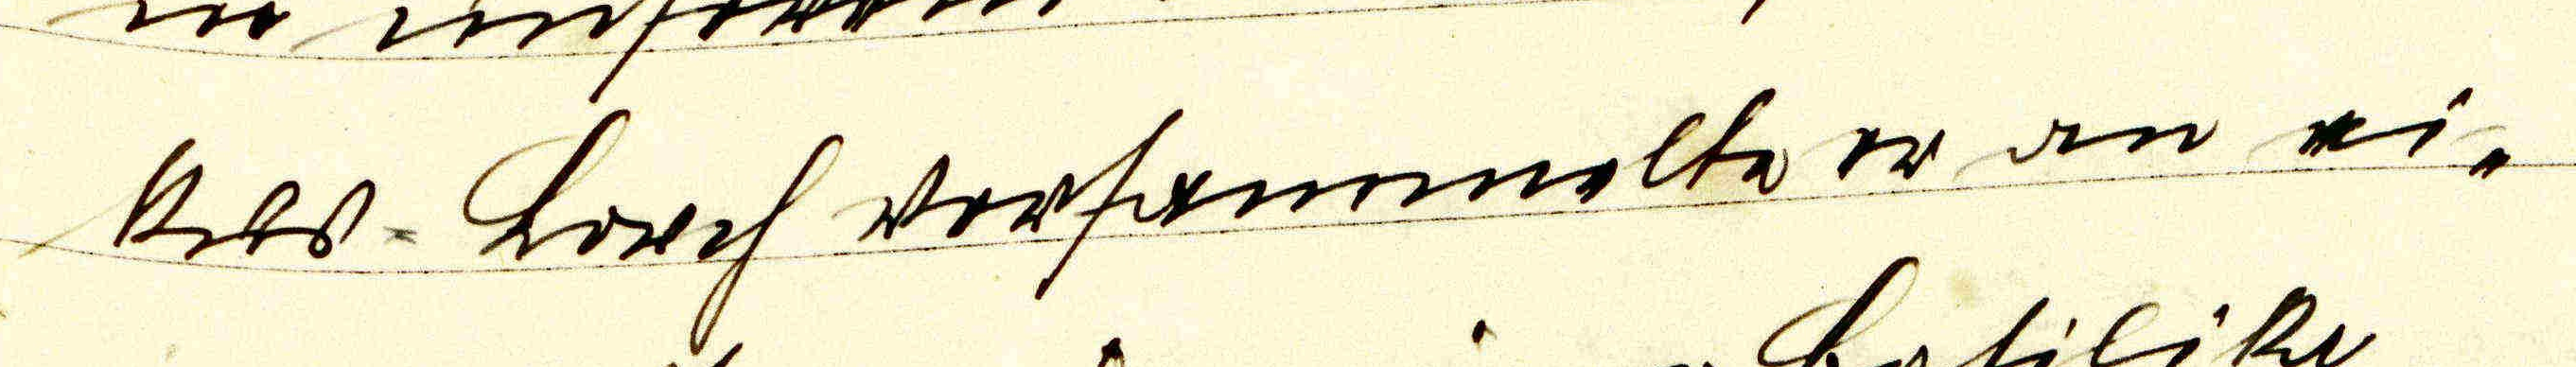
kus-Lorch versammelte er an ei-
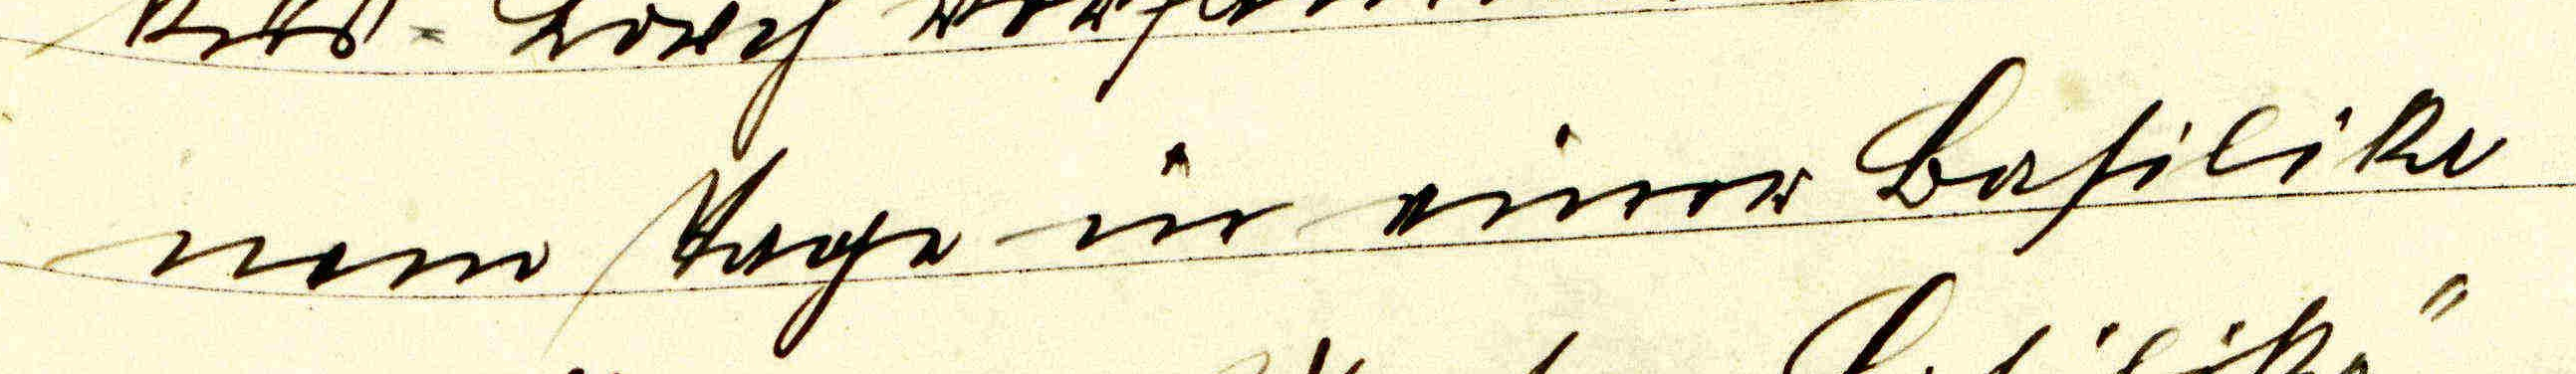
nem Tage in einer Basilika
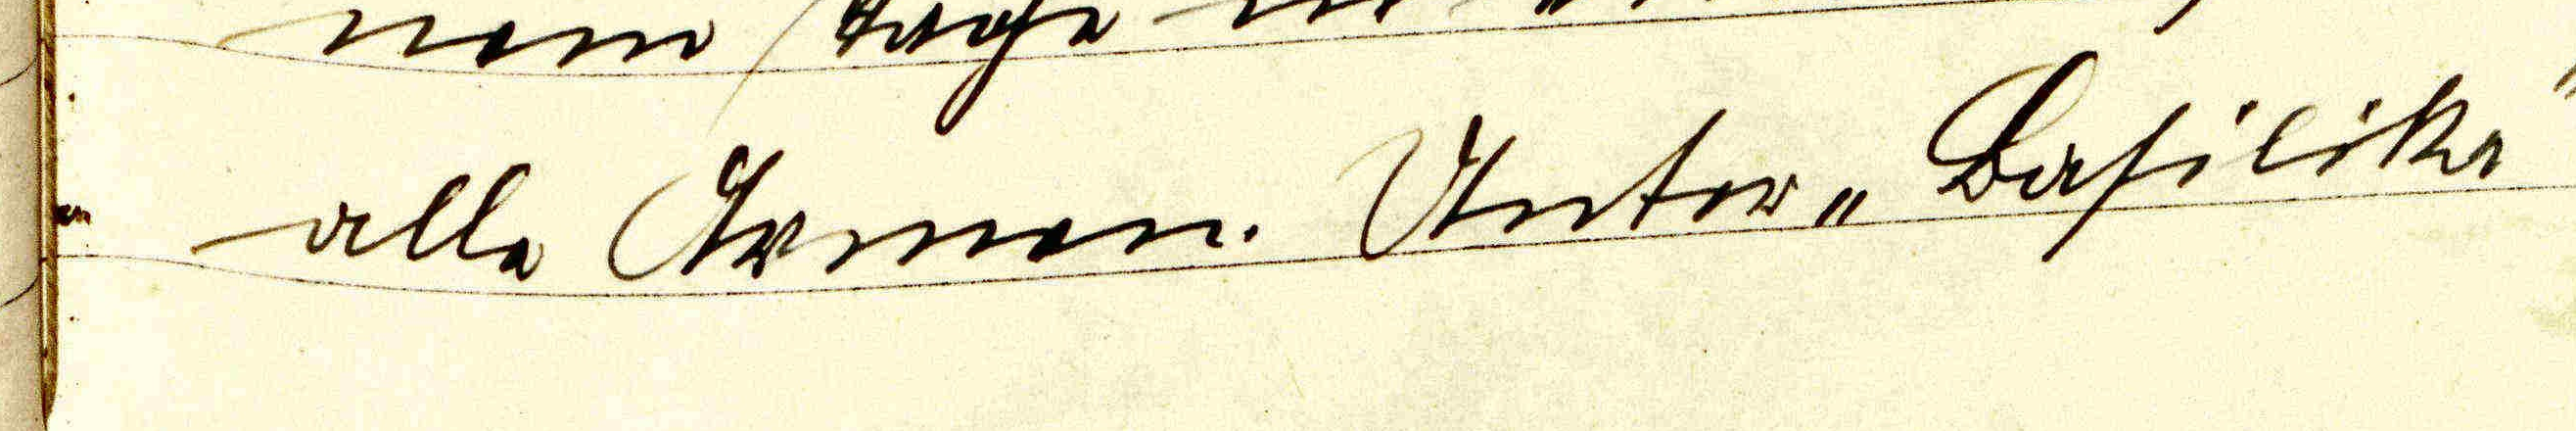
alle Armen. Unter „Basilika“
